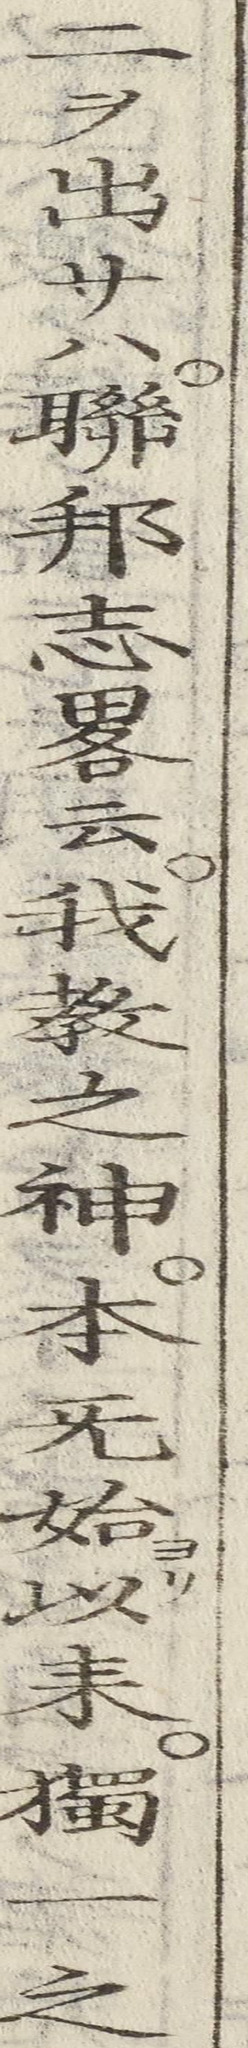二ヲ出サハ。連邦志略云。我教之神。本無始以来。独一之
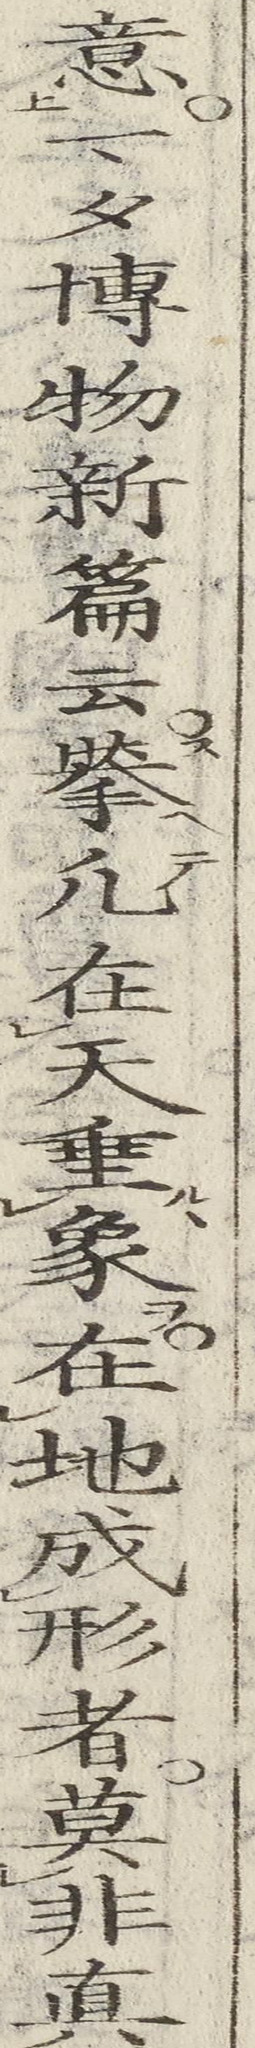意。マタ博物新篇云。挙凡在天垂ヽ象。在地成形者。莫非真
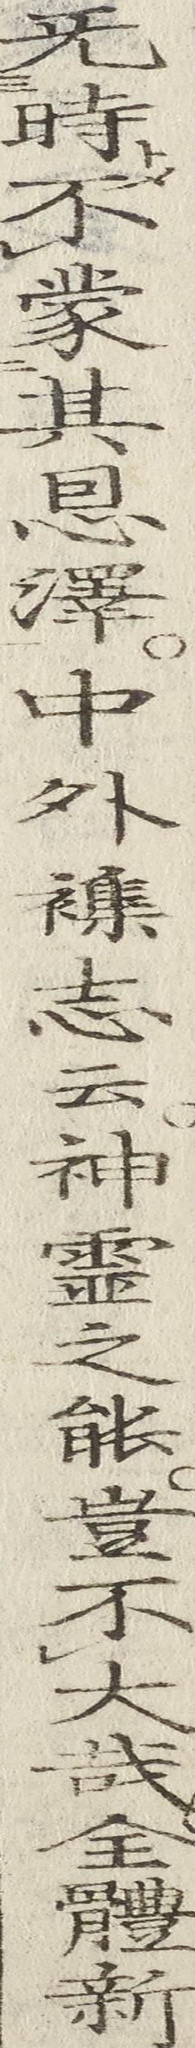無時不蒙其恩沢。中外襍志云。神霊之能。豈不大哉。全体新
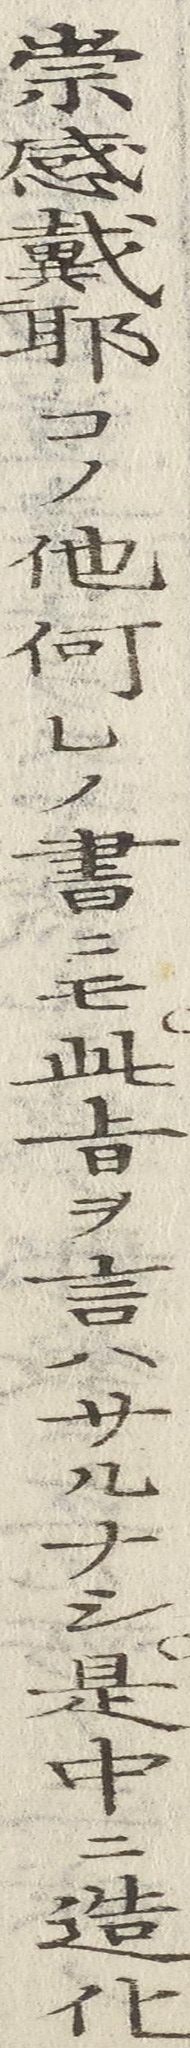崇感戴耶コノ他何レノ書ニモ。此旨ヲ言ハサルナシ。其中ニ造化
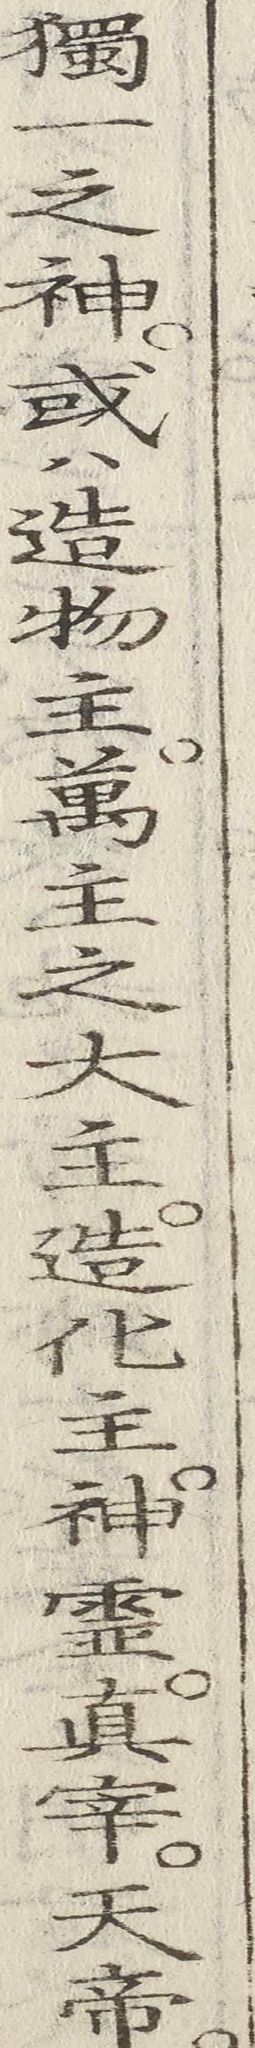独一之神。或ハ造物主。万主之大主。造化主。神霊。真宰。天帝。
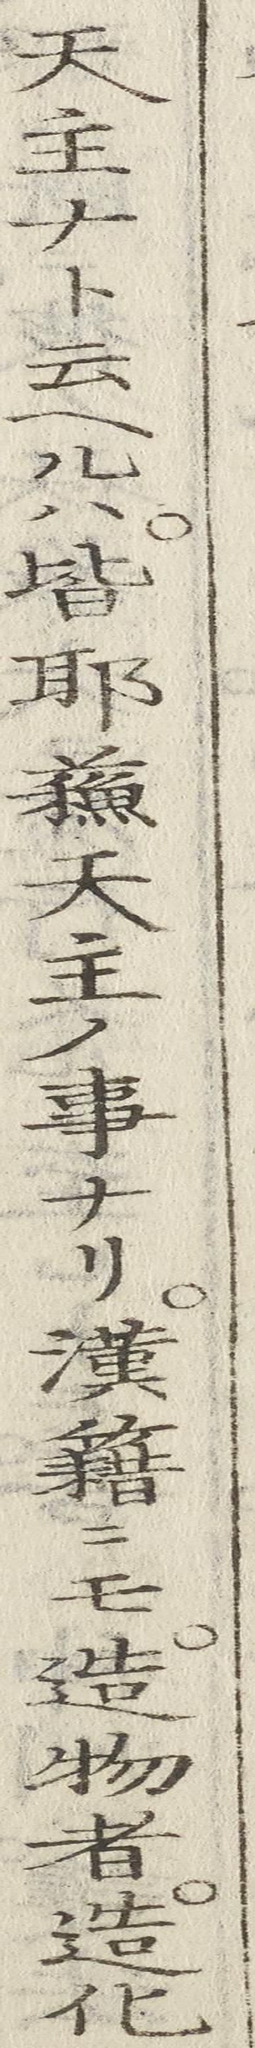天主ナト云ヘルハ。皆耶蘇天主ノ事ナリ。漢籍ニモ。造物者。造化
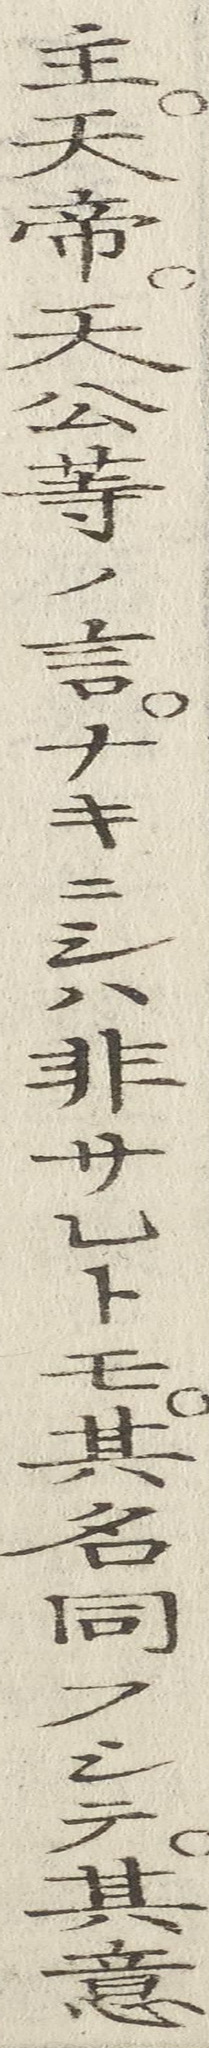主。天帝。天公等ノ言。ナキニシハ非サレトモ。其名同フシテ。其意
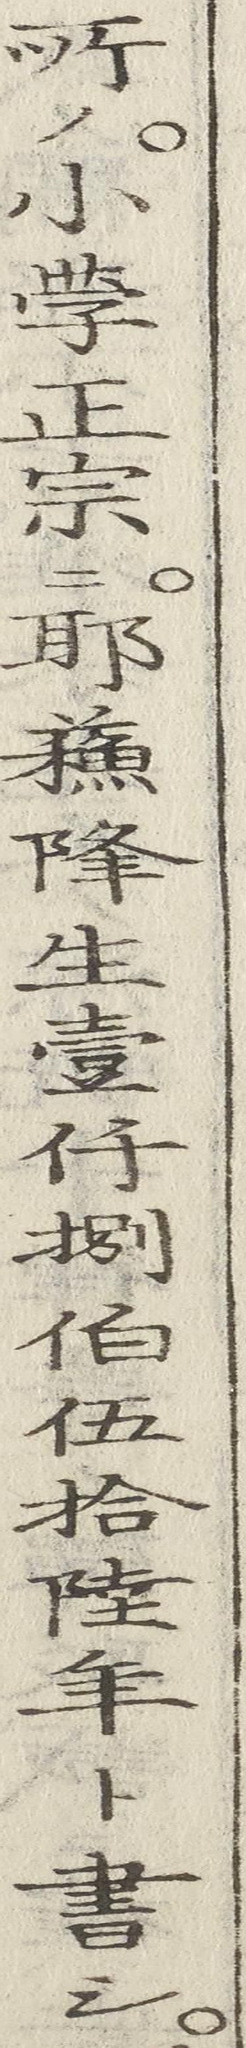所ノ。小学正宗ニ。耶蘇降生壹仟捌伯伍拾陸年ト書シ。其他

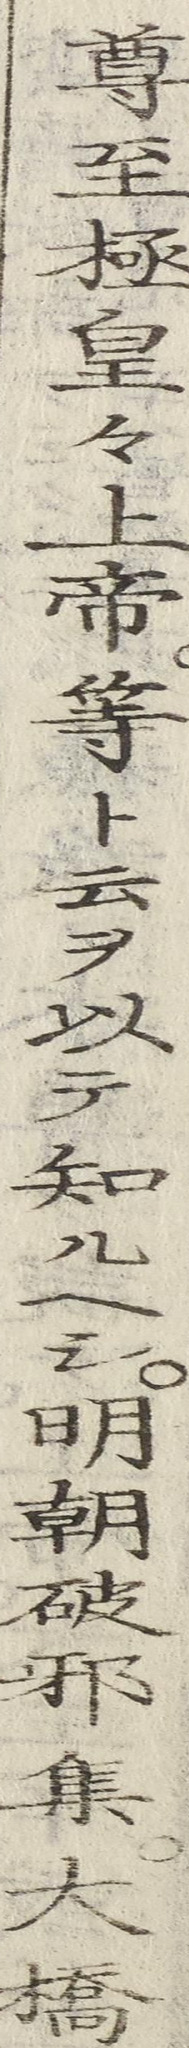尊。至極皇々上帝。等ト云ヲ以テ知ルヘシ。明朝破邪集大橋
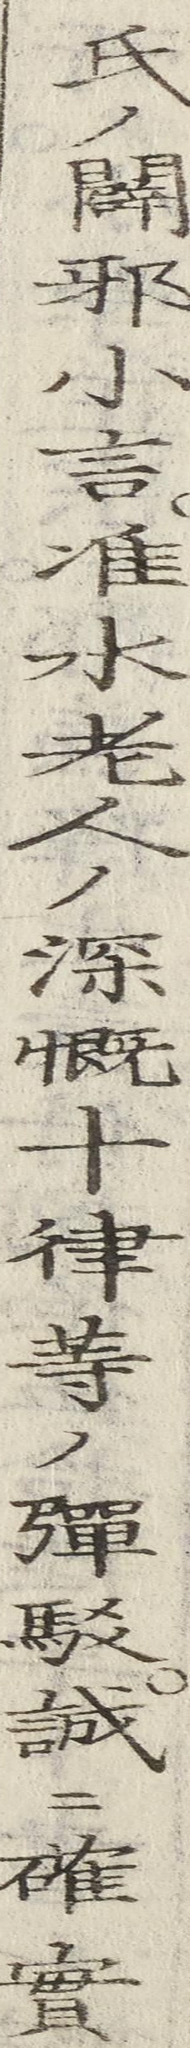氏ノ闢邪小言。准水老人ノ深慨十律等ノ弾駁。誠ニ確実
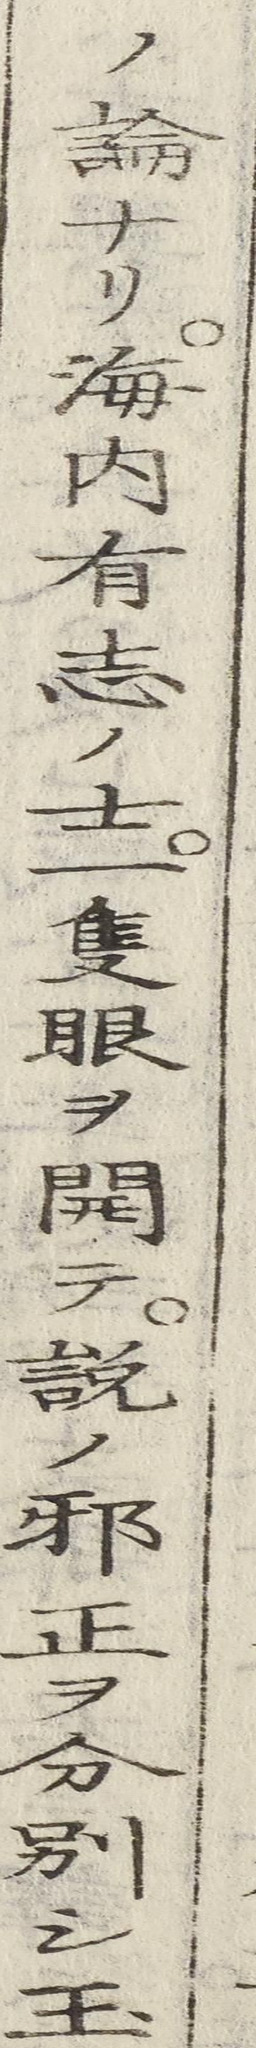ノ論ナリ。海内有志ノ士。一隻眼ヲ開テ。説ノ邪正ヲ分別シ玉
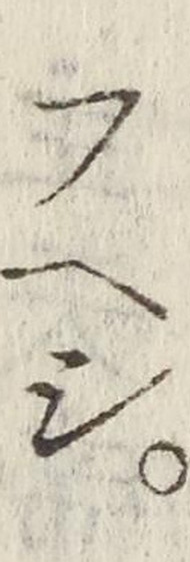フヘシ。
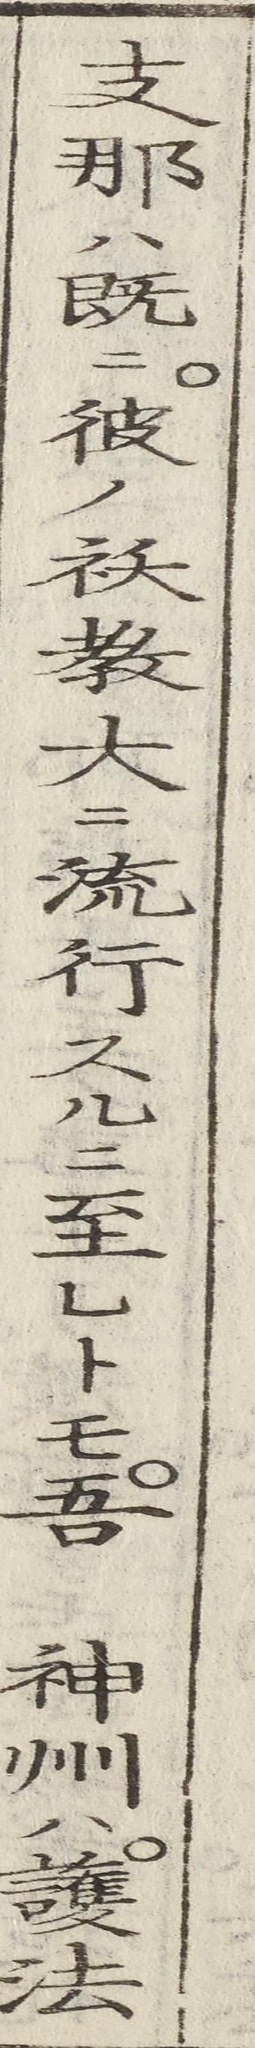支那ハ既ニ。彼ノ妖教大ニ流行スルニ至レトモ。吾神州ハ。護法
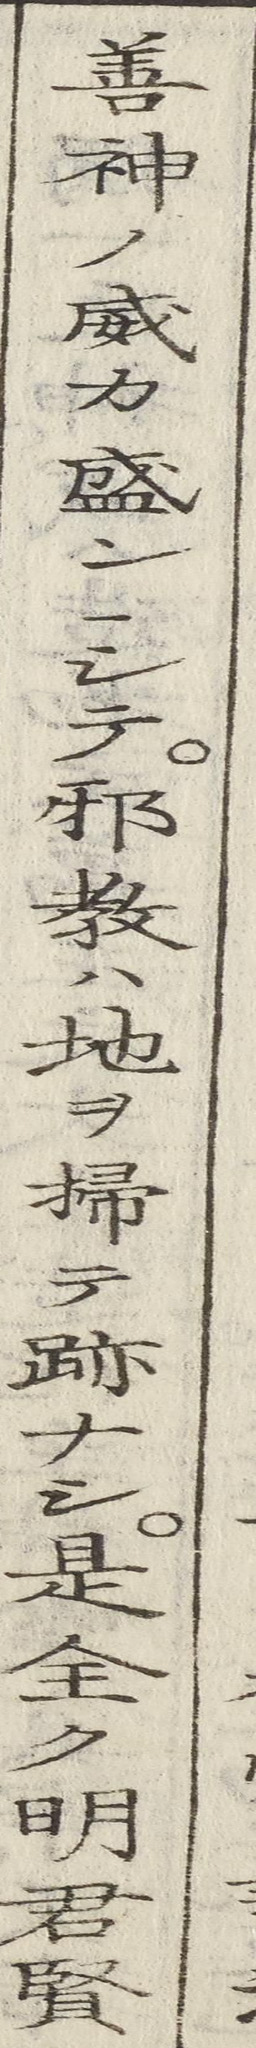善神ノ威カ盛ンニシテ。邪教ハ地ヲ掃テ跡ナシ。是全ク明君賢
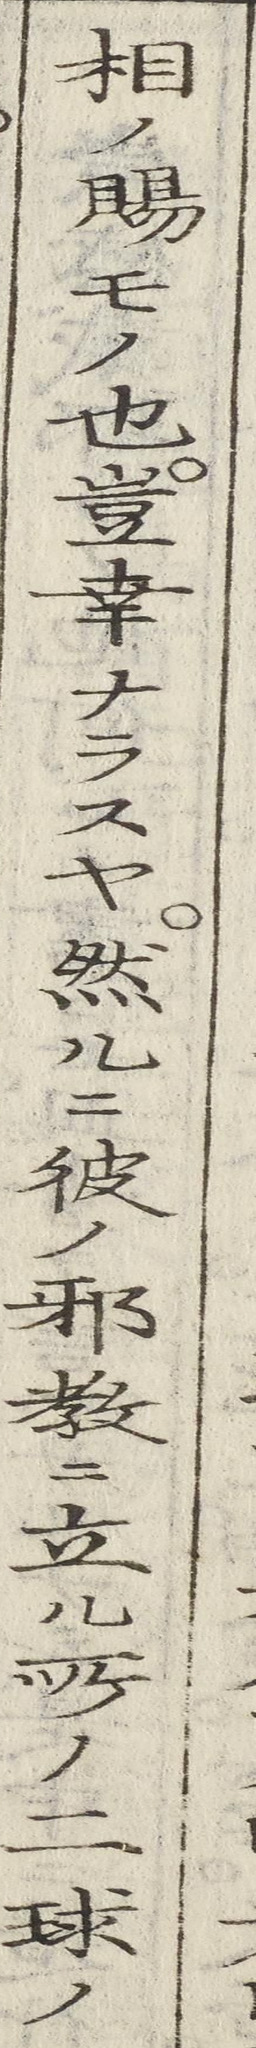相ノ賜モノ也。豈幸ナラスヤ。然ルニ彼ノ邪教ニ立ル所ノ二球ノ
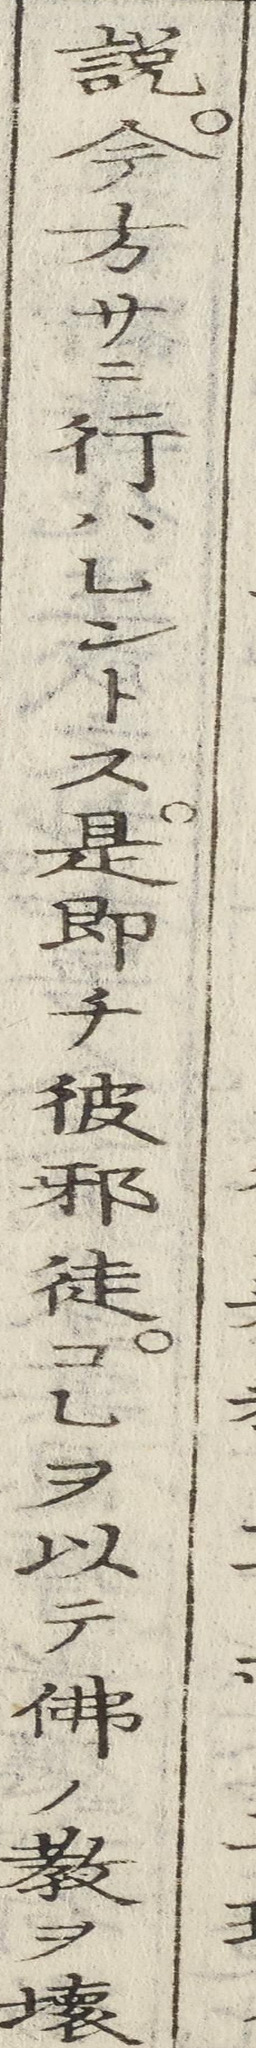説。今方サニ行ハレントス。是即チ彼邪徒。コレヲ以テ仏ノ教ヲ壊
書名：護法新論　上
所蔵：東京大学地震研究所図書室 Earthquake Research Institute Library, The University of Tokyo, JAPAN
